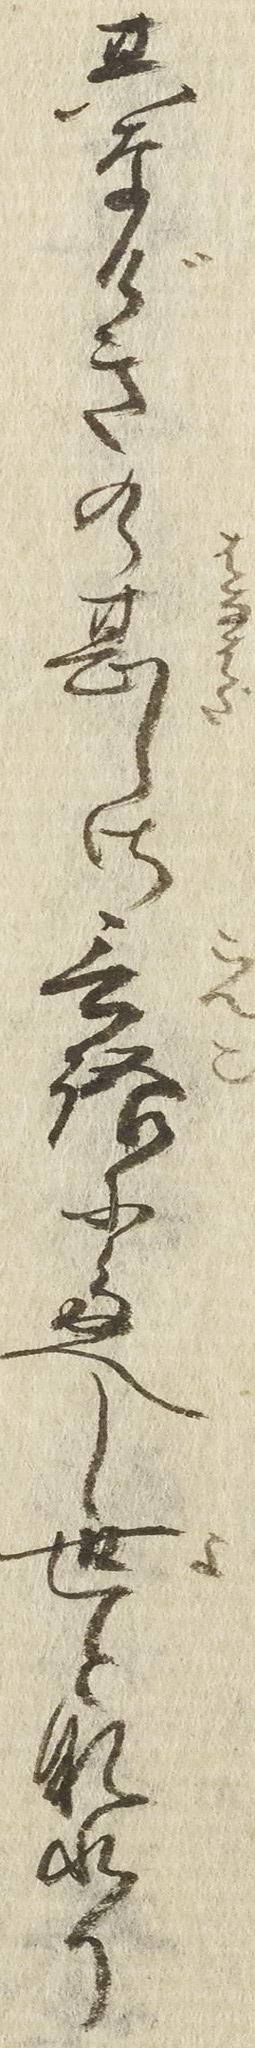其なげきの甚しさ言語にたへし世となれり
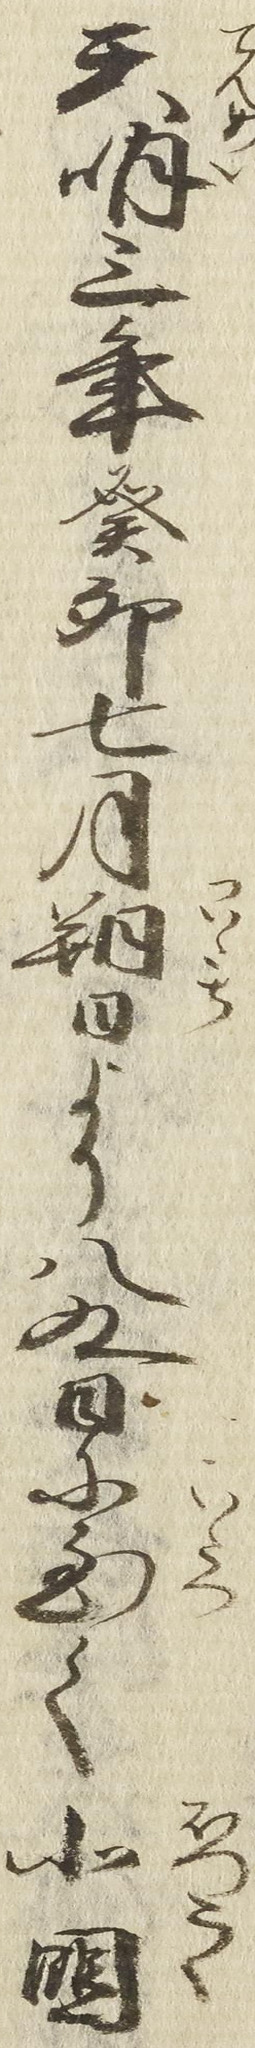天明三年癸卯七月朔日より八九日に至て北国
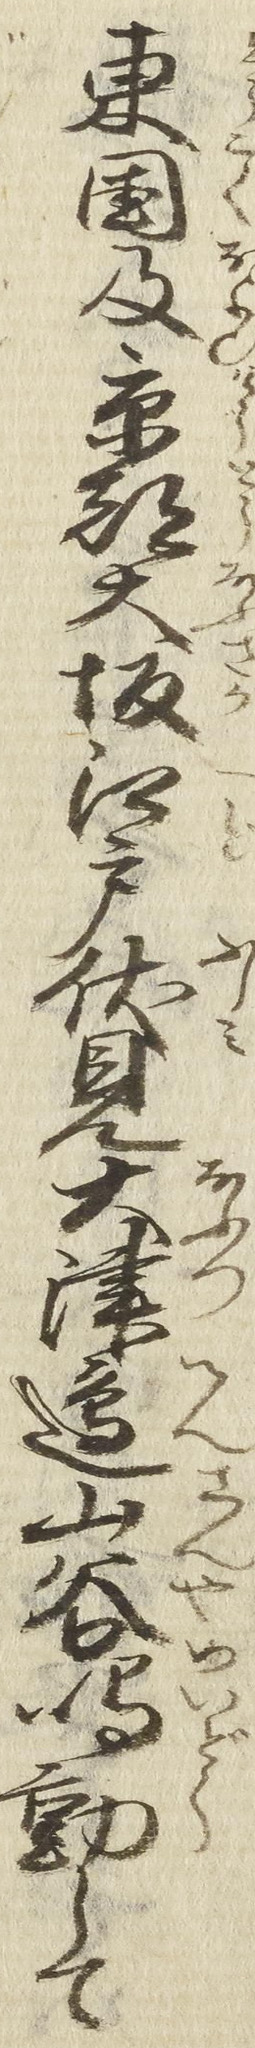東国及京都大坂江戸伏見大津辺山谷鳴動して
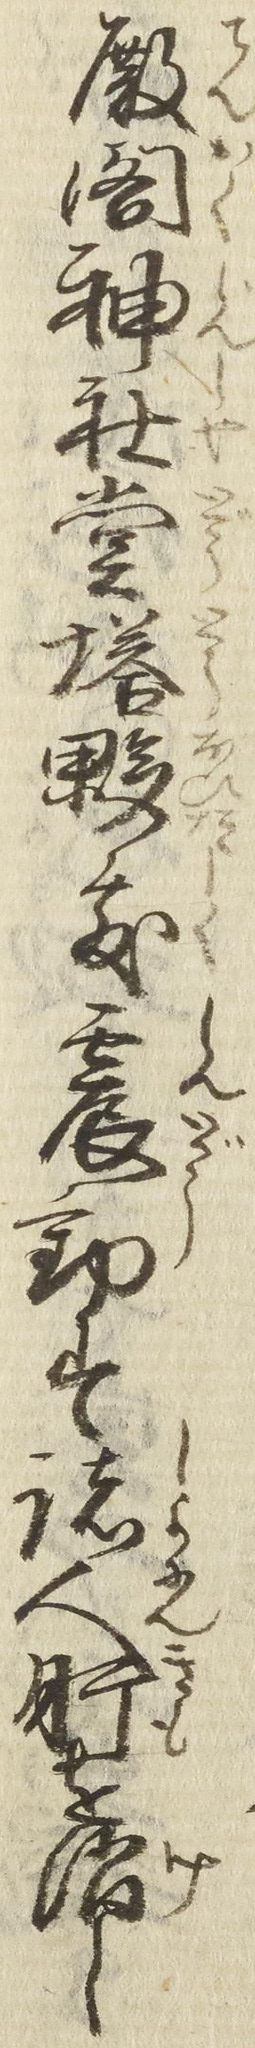殿閣神社堂塔夥敷震動す諸人肝を消し
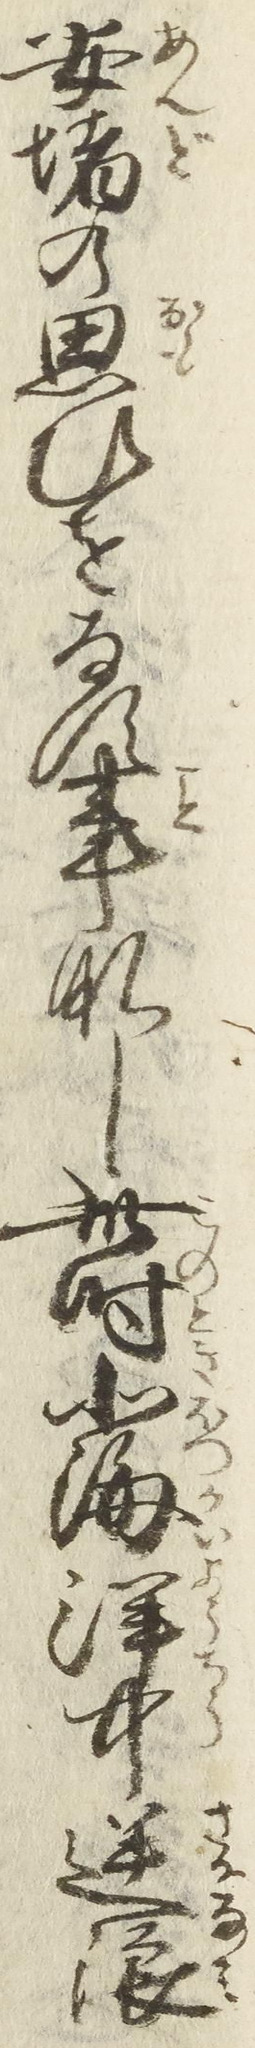安堵の思ひをなす事なし此時北海洋中逆浪
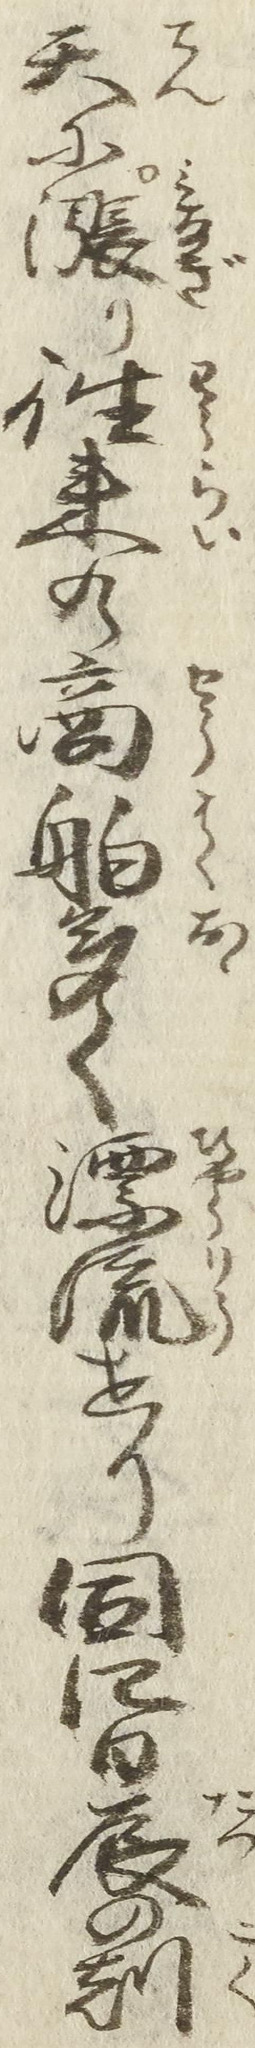天に漲り往来の商舶多く漂流せり同四日辰の刻
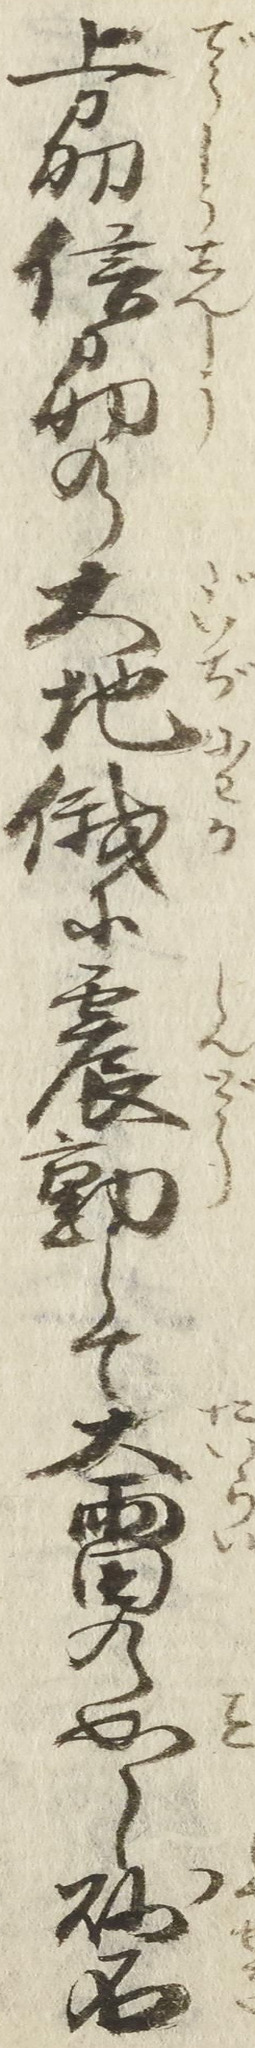上州信州の大地俄に震動して大雷の如し砂石
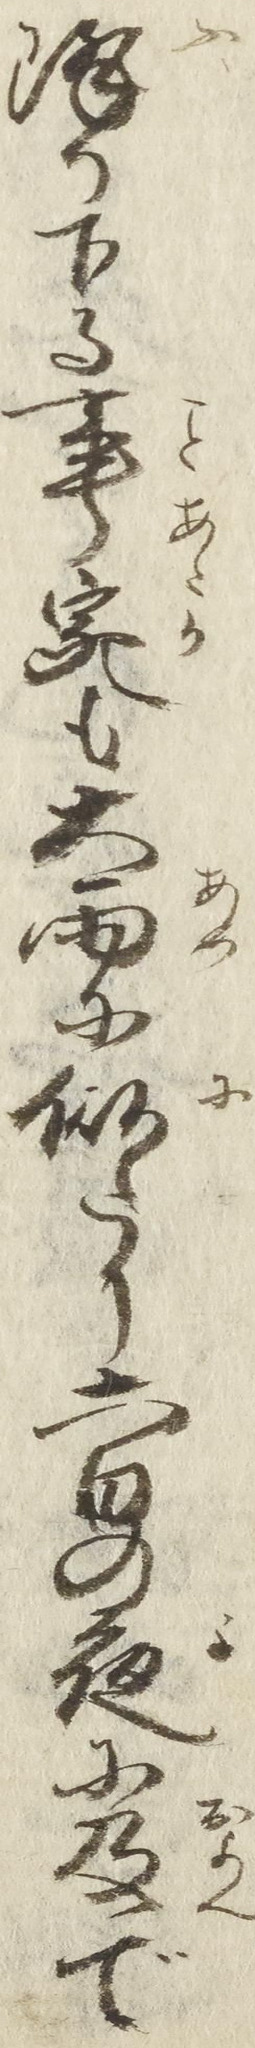降り下る事宛も大雨に似たり六日の夜に及で
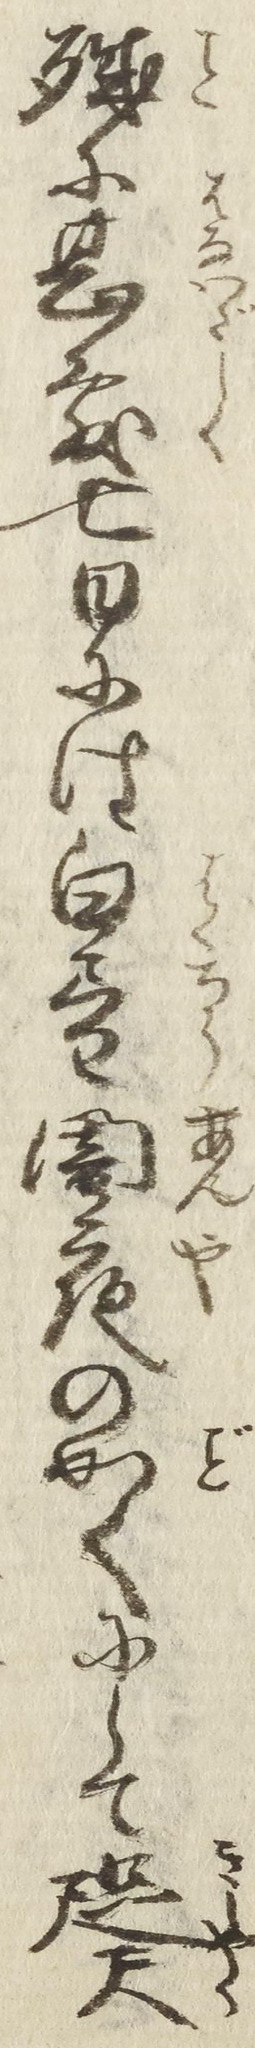殊に甚敷七日には白昼闇夜の如くにして咫尺
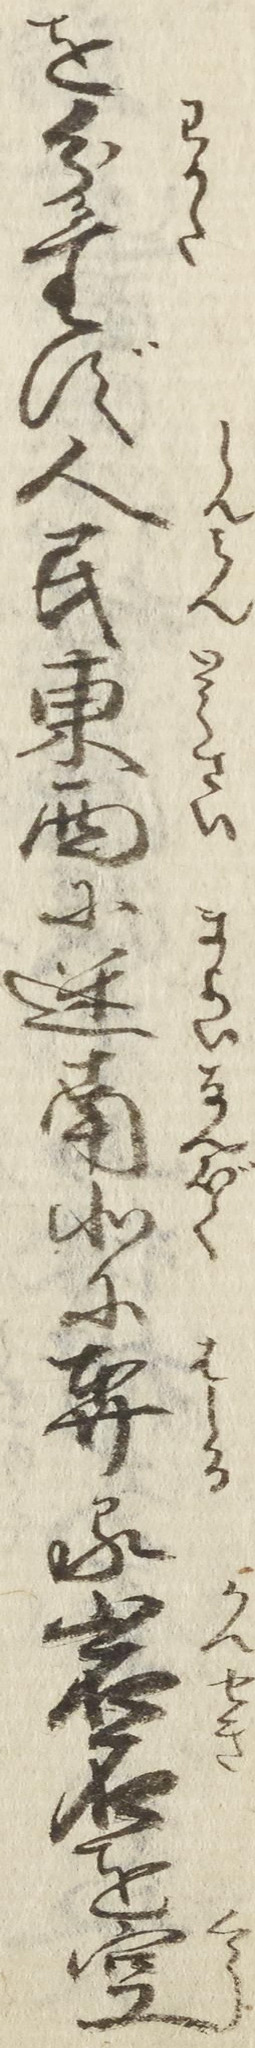を分堂ず人民東西に迷南北に奔る岩石を空
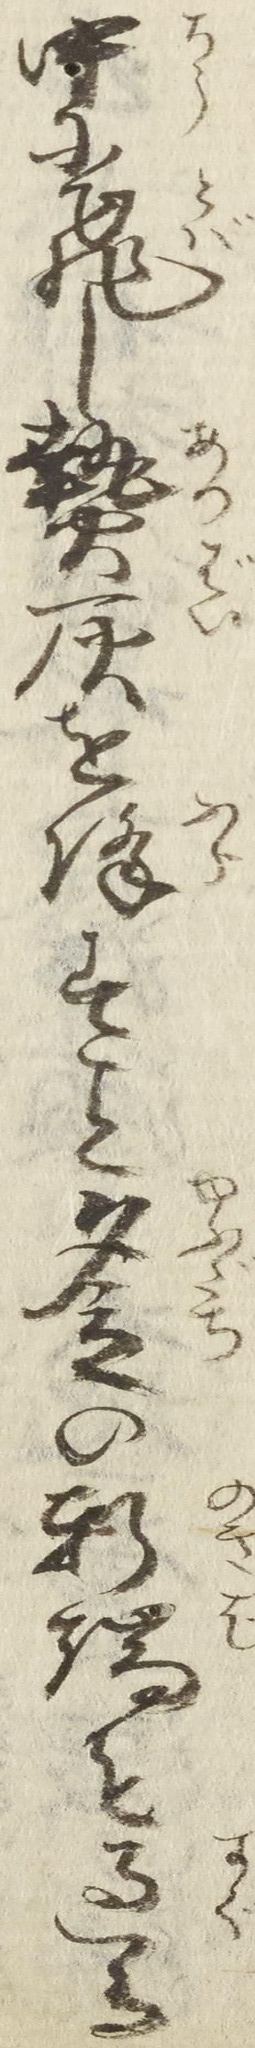中に飛し熱灰を降すこと夕立の軒端を過る
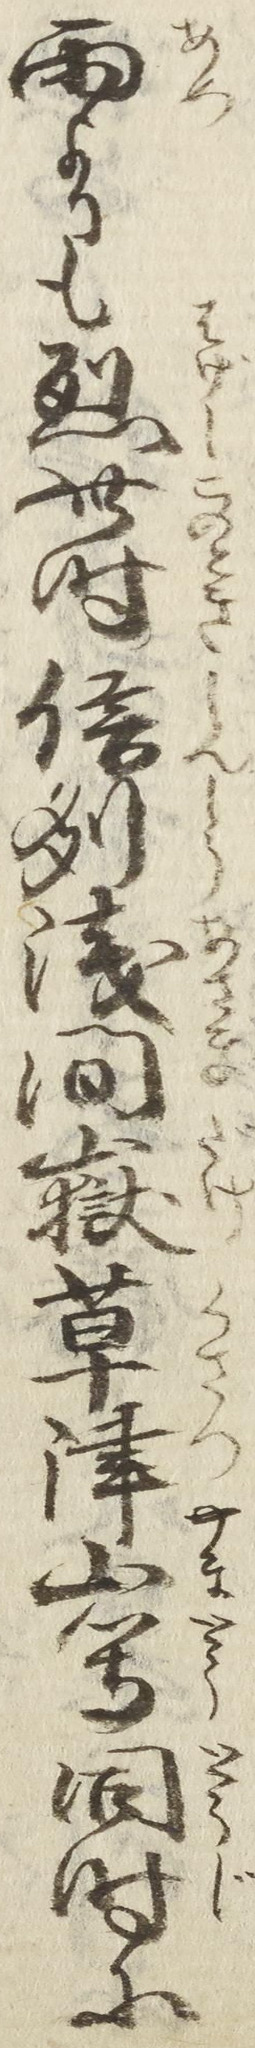雨よりも烈此時信州浅間嶽草津山等同時に

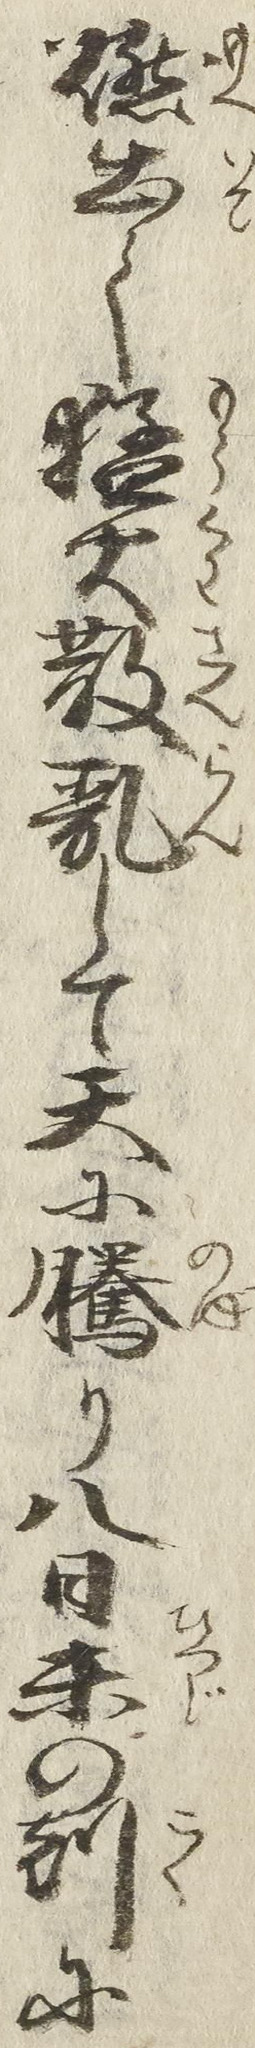燃出て猛火散乱して天に騰り八日未の刻に
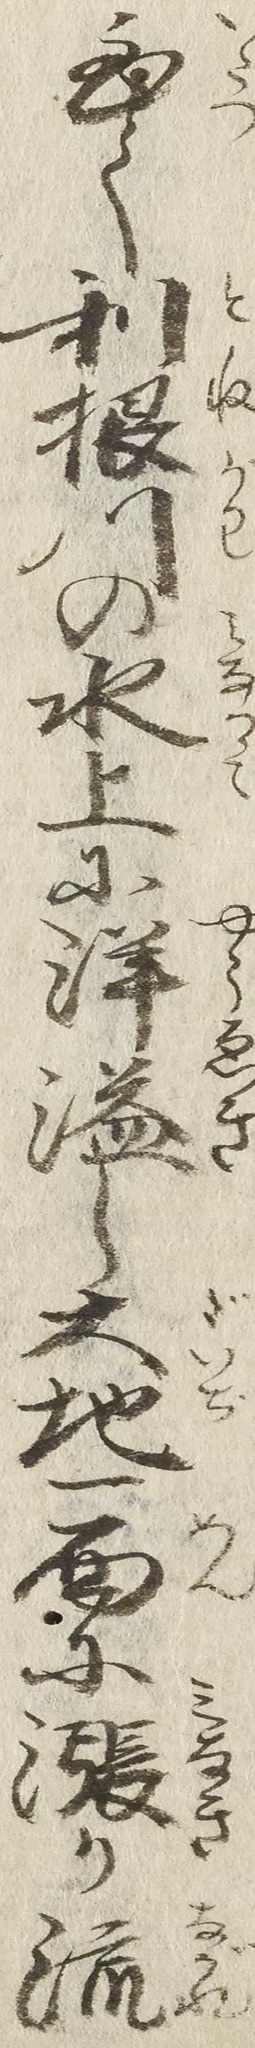至て利根川の水上に洋溢し大地一面に漲り流
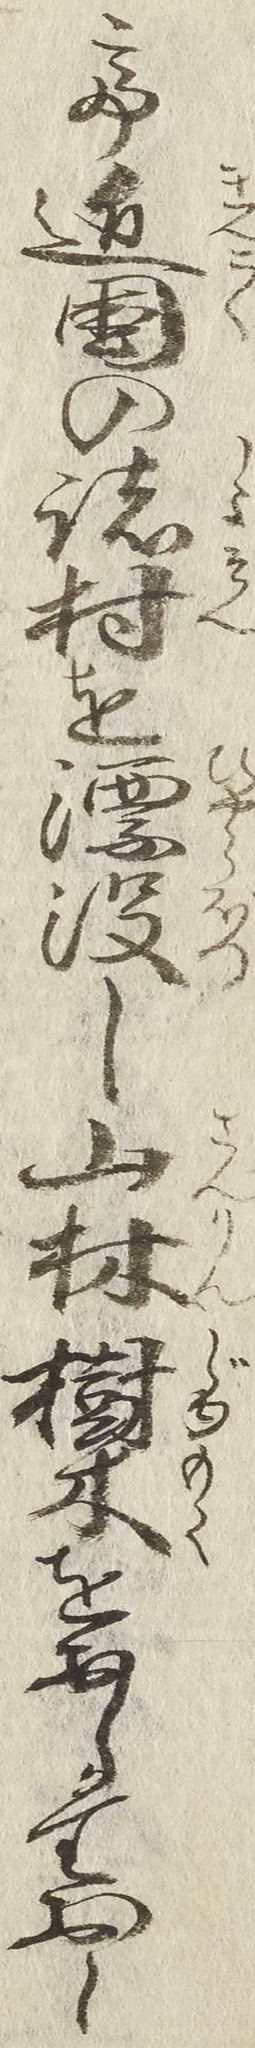て近国の諸村を漂没し山林樹木をおしたおし
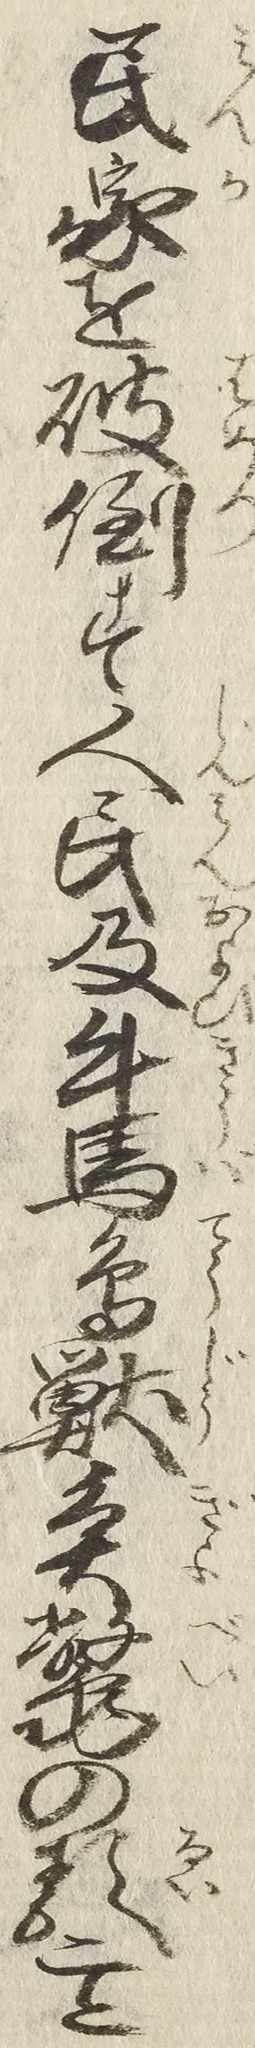民家を破倒す人民及牛馬鳥獣魚鼈の類こと
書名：天明奇畧　全
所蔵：東京大学地震研究所図書室 Earthquake Research Institute Library, The University of Tokyo, JAPAN
